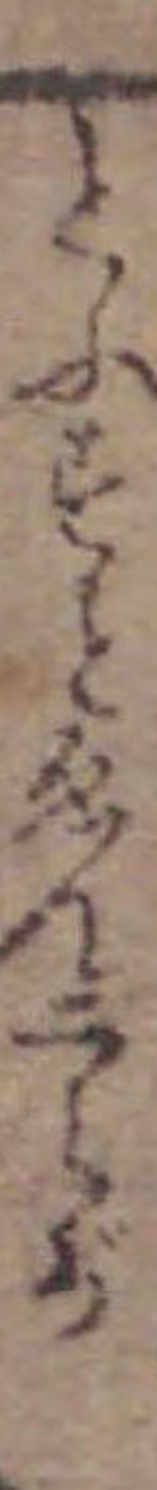とふすとゑん二郎が
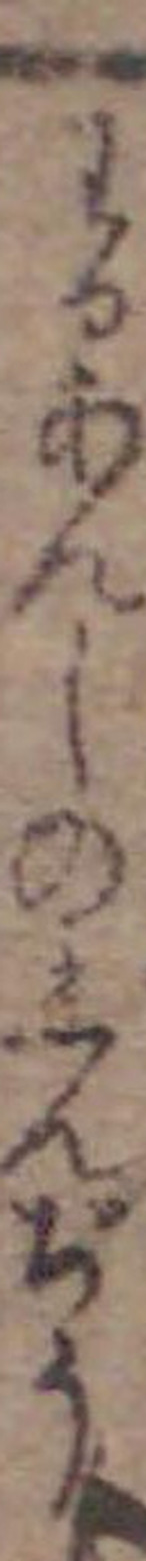わるあんしのしんじう
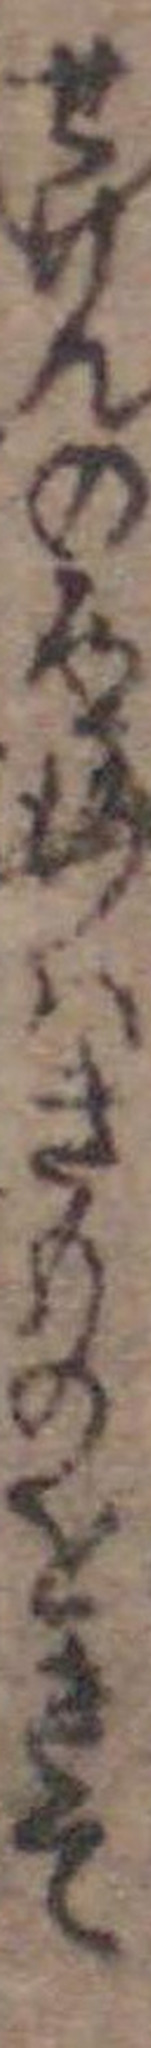せけんの道行はきものをきて
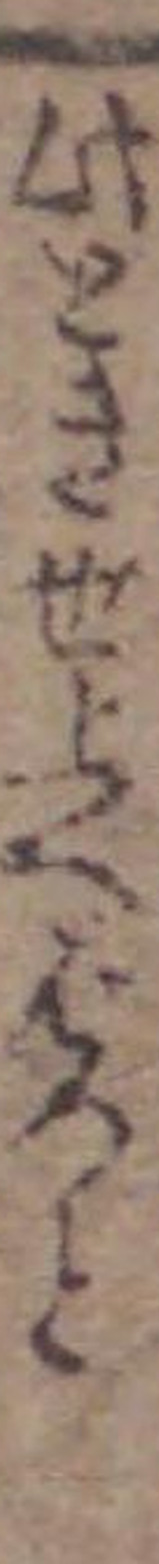此とき世上へばつと
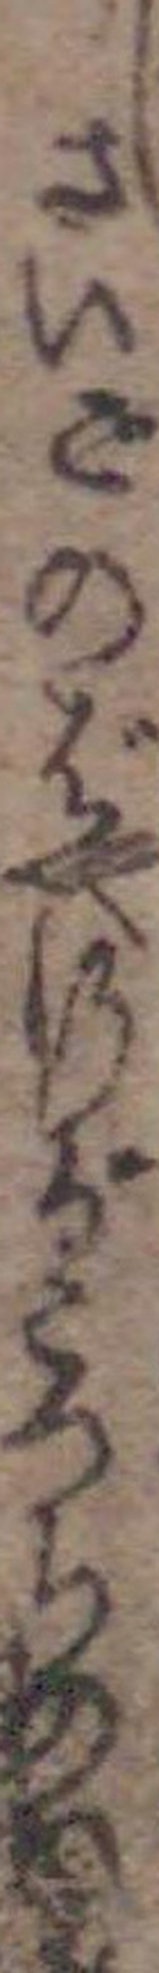さいごのばへ行がこつちのは
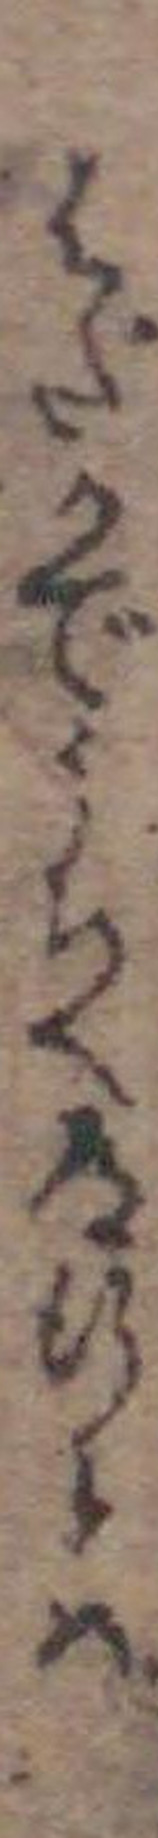はだかでうちへ道行とは
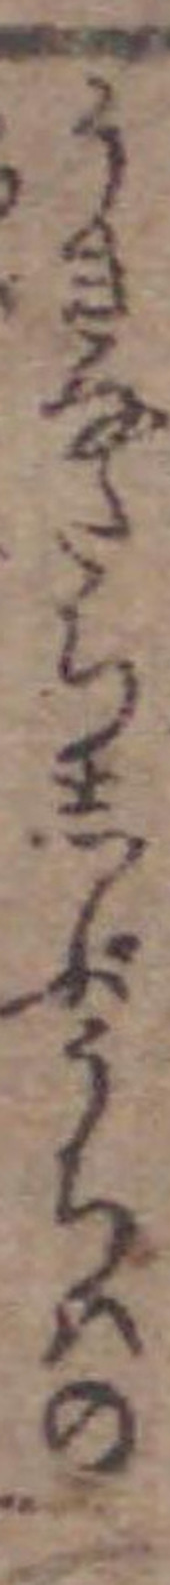うきなたちしぶうちはの
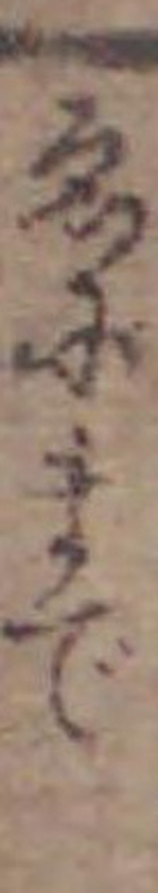ゑにまで
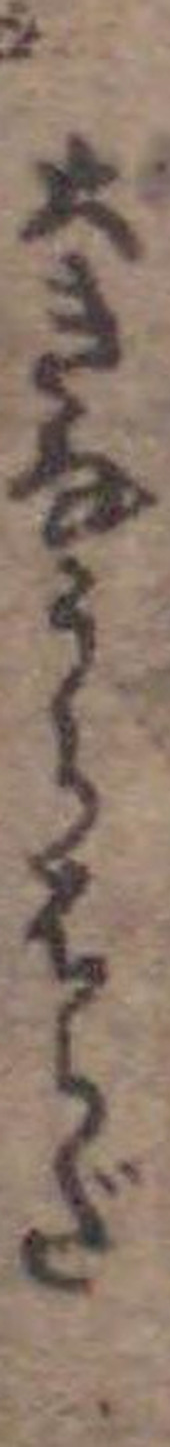大きなうらはらだ
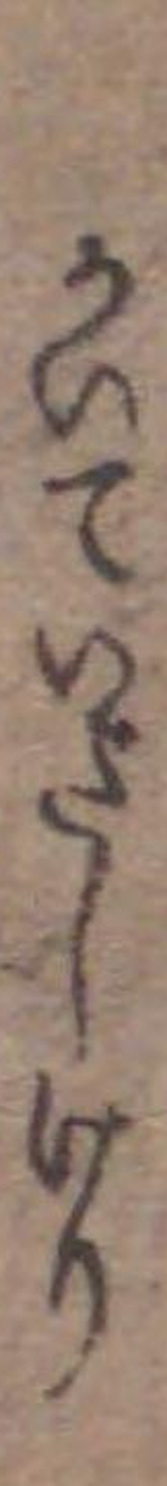かいていだしけり
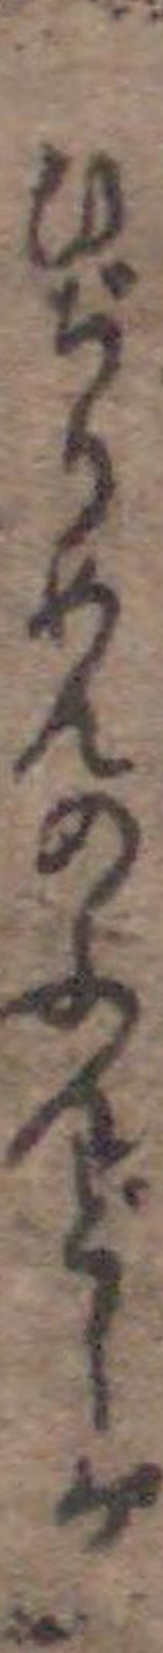ひぢりめんのふんどしが
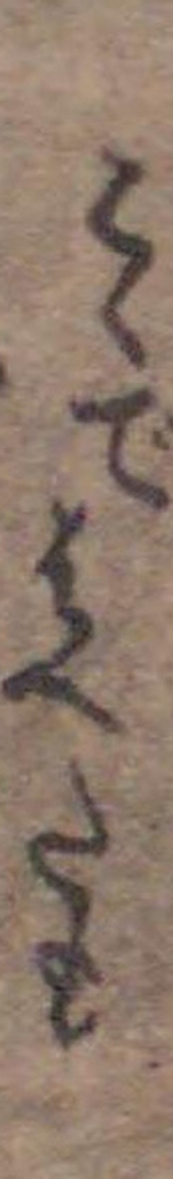こゝではへたも
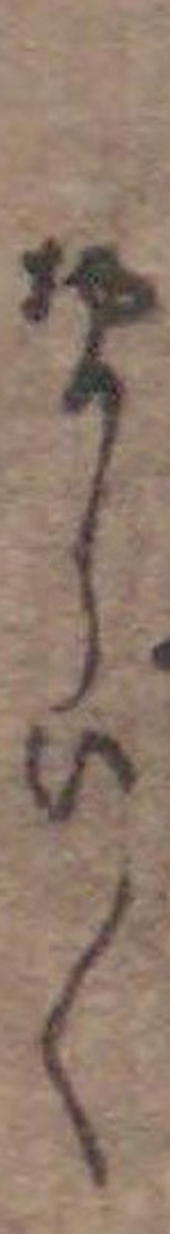おかしい〳〵
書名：江戸生艶気樺焼 : 3巻
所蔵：国立国会図書館 National Diet Library, JAPAN
